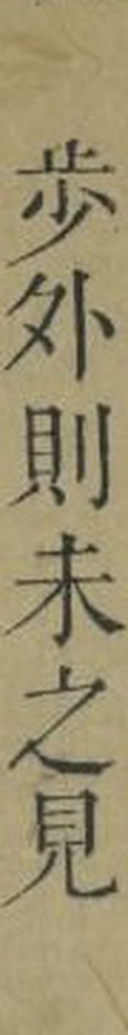歩外則未之見
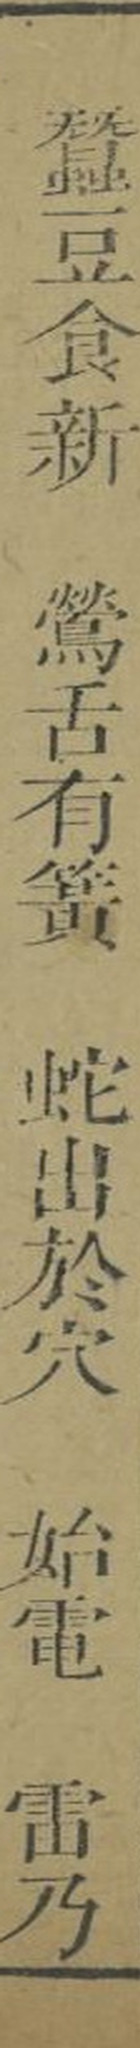蠶豆食新鶯舌有簧蛇出於穴始電雷乃
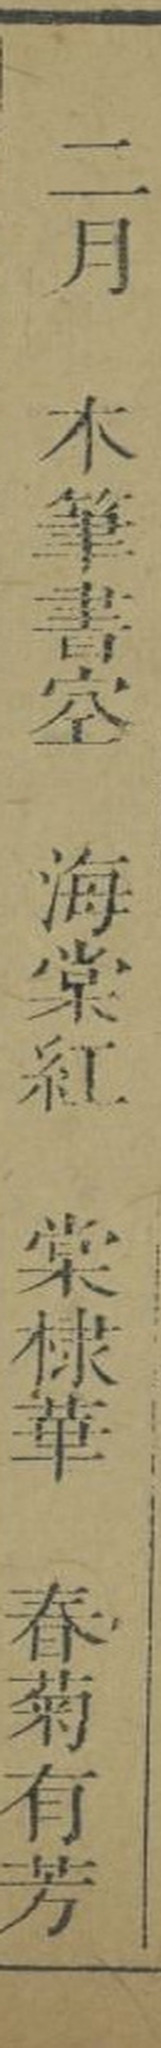二月木筆書空海棠紅棠棣華春菊有芳
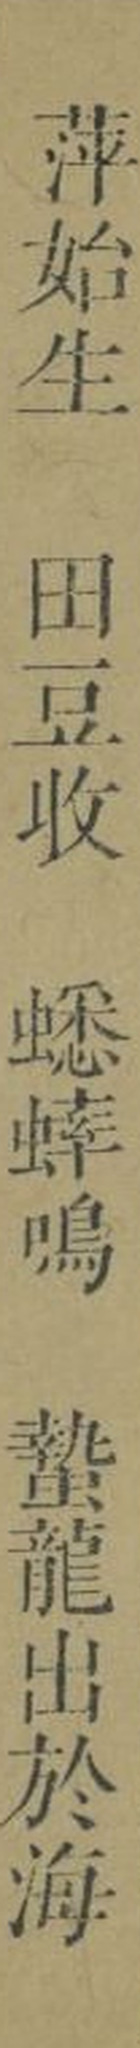萍始生田豆收蟋蟀鳴蟄竜出於海
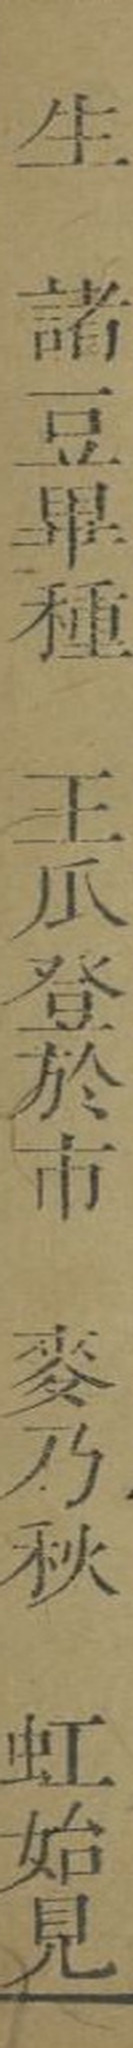生諸豆畢種王瓜登於市麦乃秋虹始見

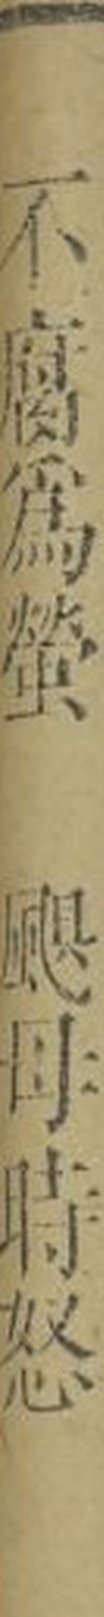不腐為蛍颶母時怒
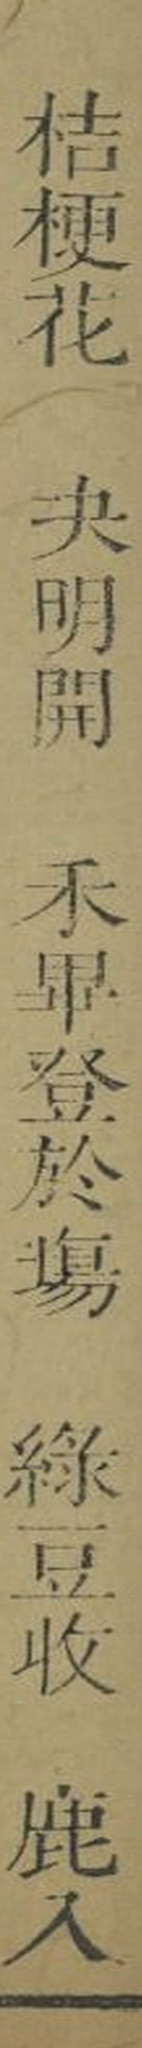桔梗花決明開禾畢登於場緑豆収鹿入

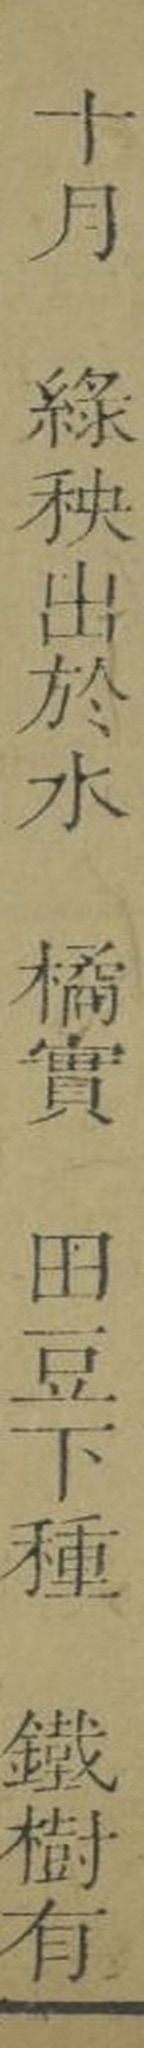十月緑秧出於水橘実田豆下種鉄樹有
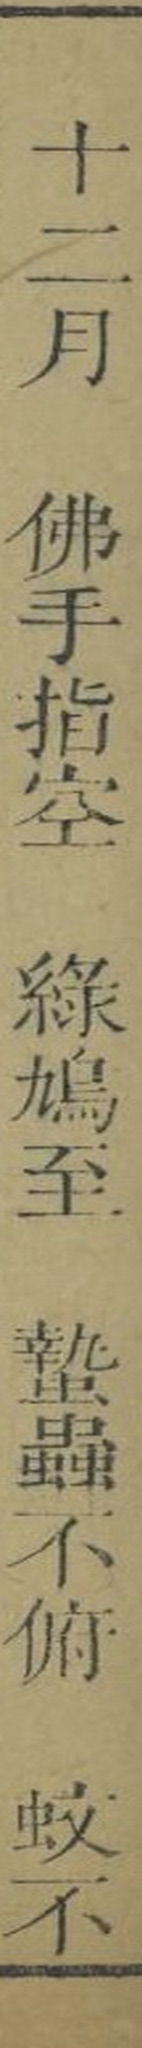十二月仏手指空緑鳩至蟄虫不俯蚊不
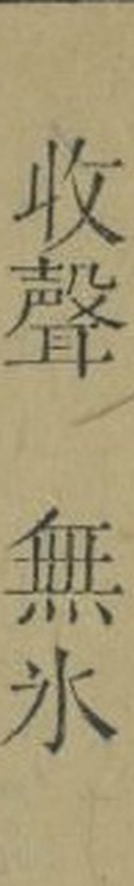収声無氷
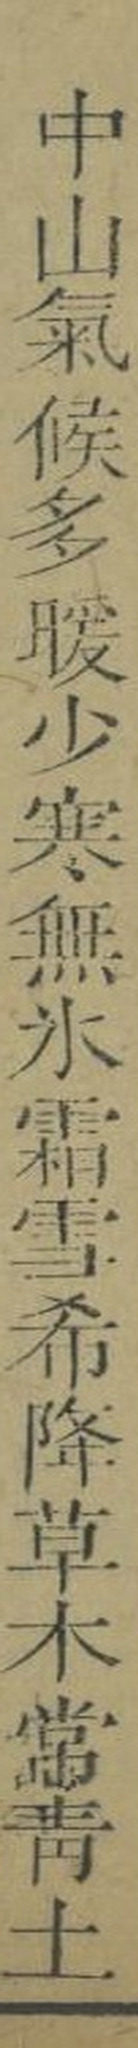中山気候多暖少寒無氷霜雪希降草木常青土
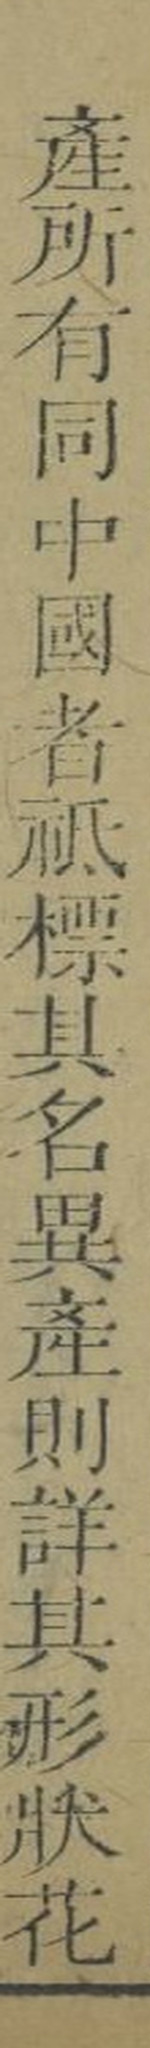産所有同中国者祇標其名異産則詳其形状花
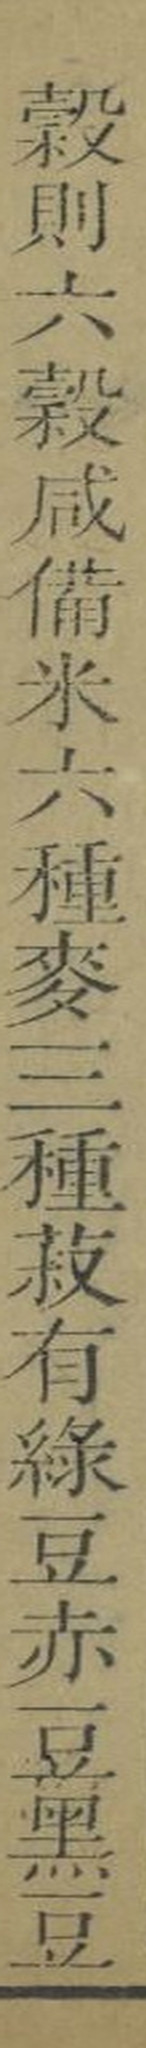穀則六穀咸備米六種麦三種菽有緑豆赤豆黒豆
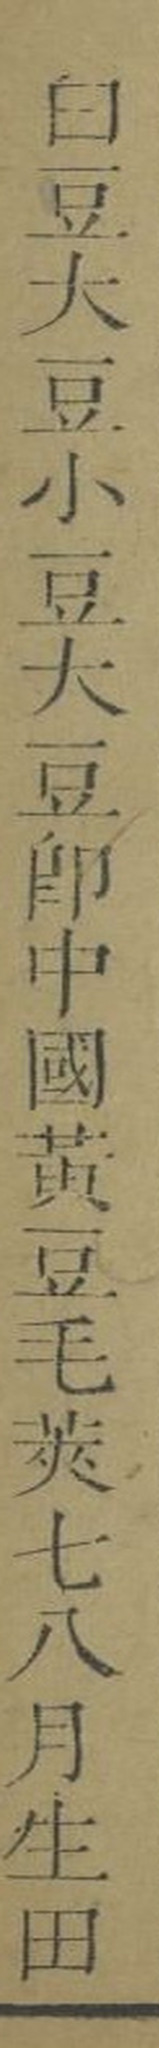白豆大豆小豆大豆即中国黄豆毛莢七八月生田

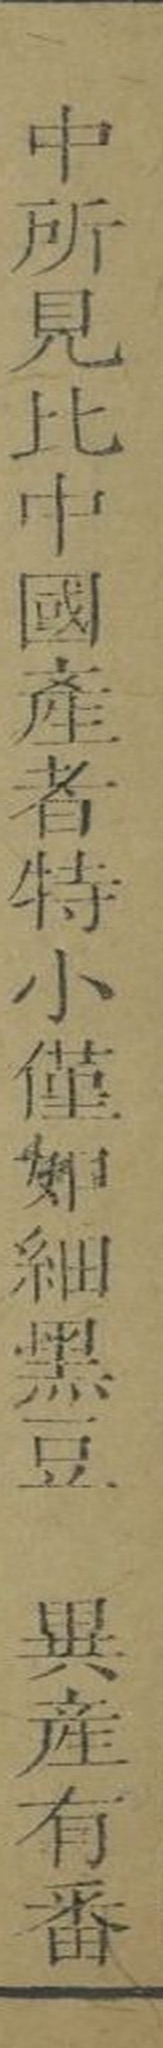中所見比中国産者特小僅如細黒豆異産有番
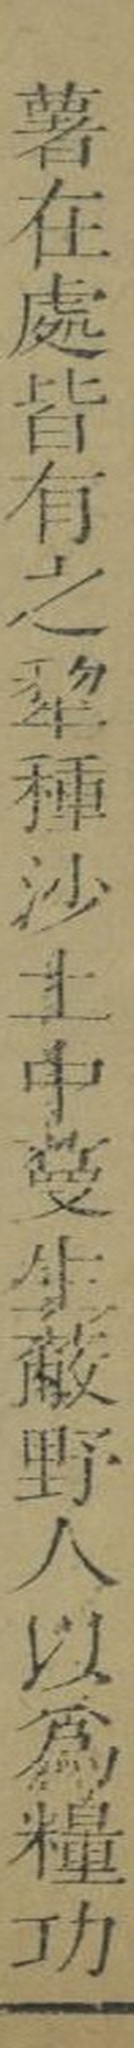薯在処皆有之犂種沙土中蔓生蔽野人以為糧功
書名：中山伝信録 巻六
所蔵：University of the Ryukyus Library
